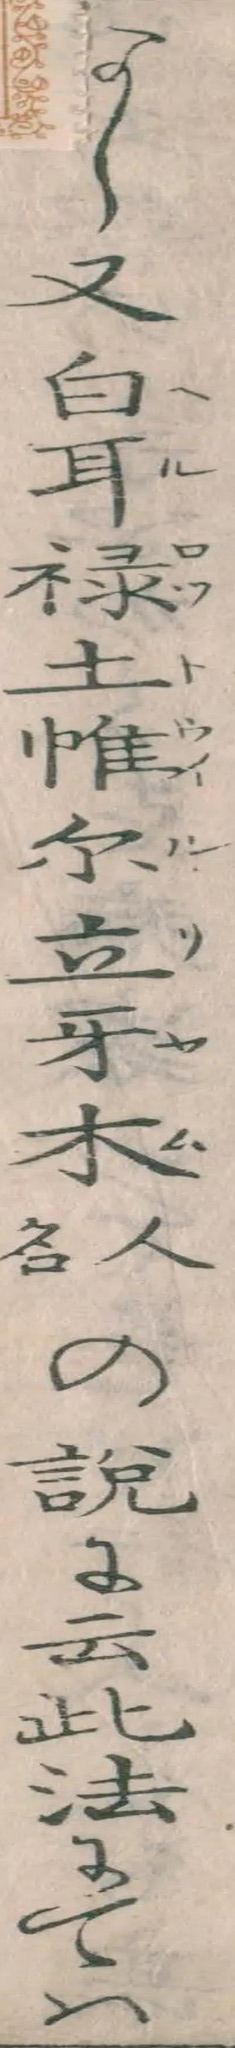なし又白耳禄土帷尓立牙木人名の説に云此法にては
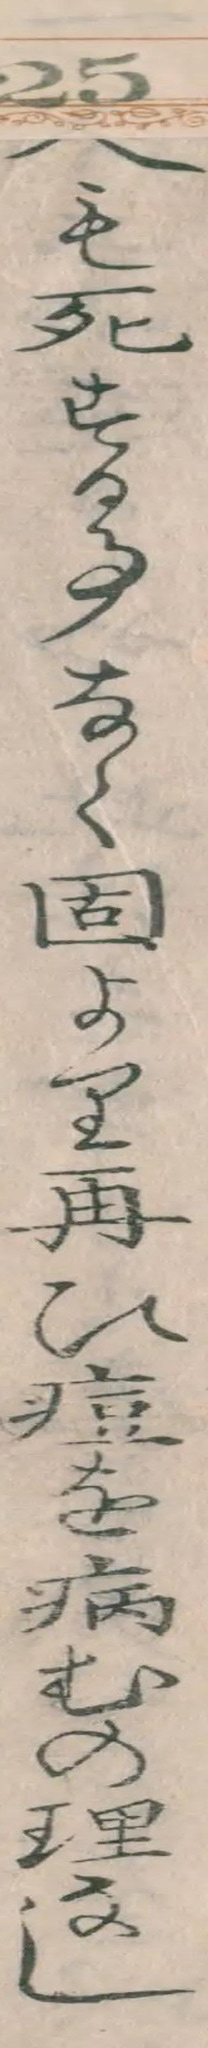人も死する事なく固より再ひ痘を病むの理なし

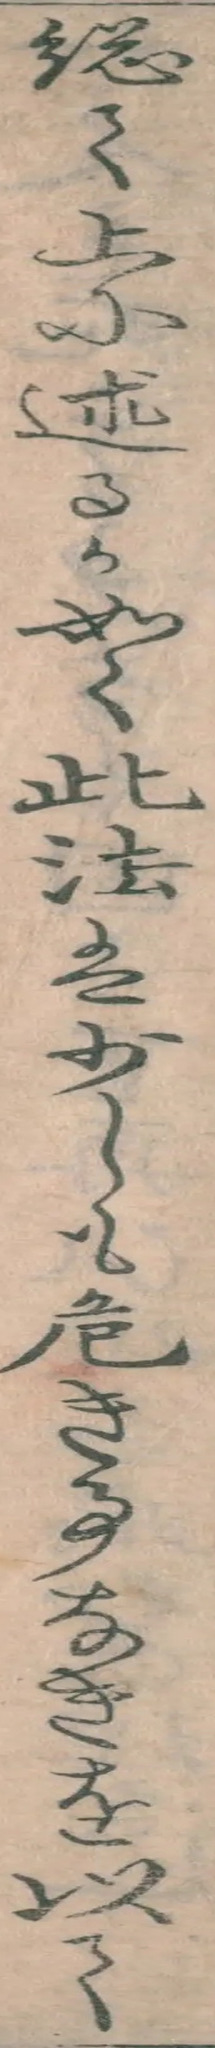總て上に述るか如く此法は少しも危き事なきを以て
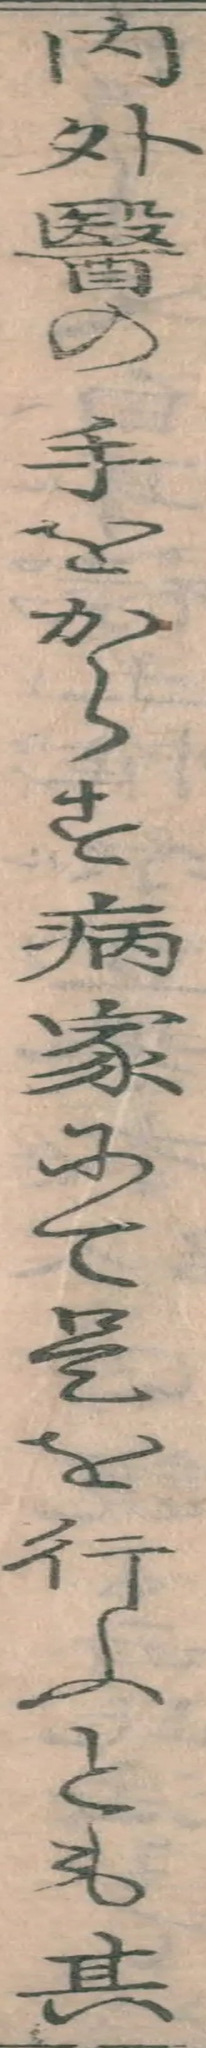内外醫の手をかゝらす病家にて是を行ふとも其
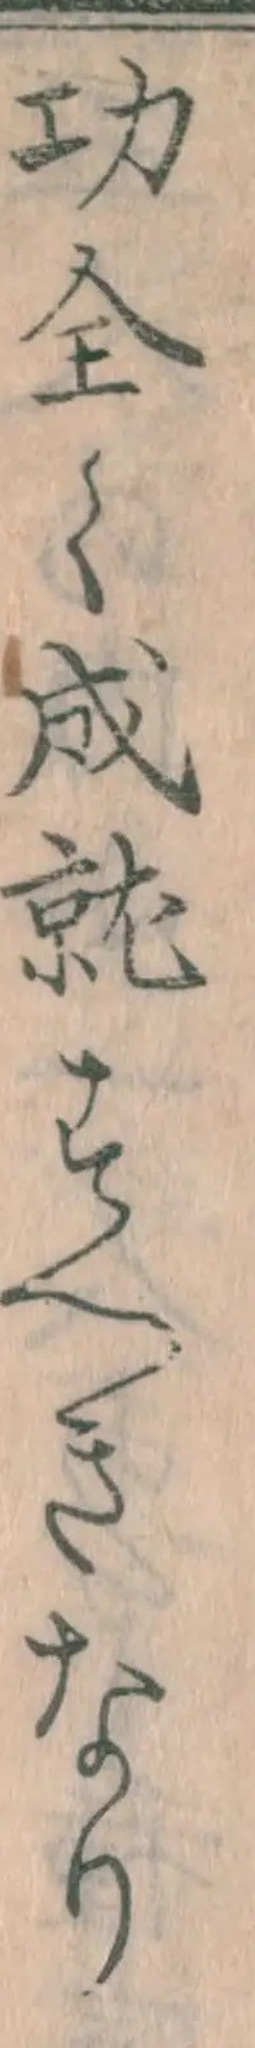功全く成就すへきなり
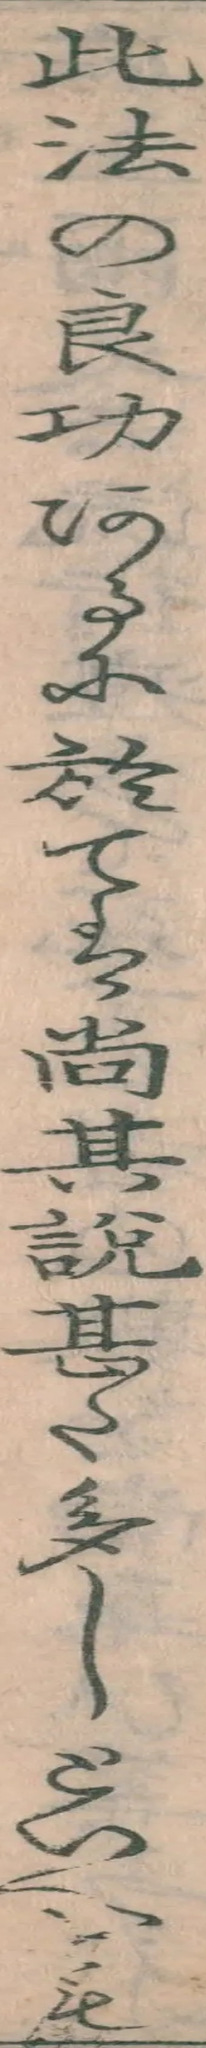此法の良好なるに於ては尚其説甚た多しといへるも
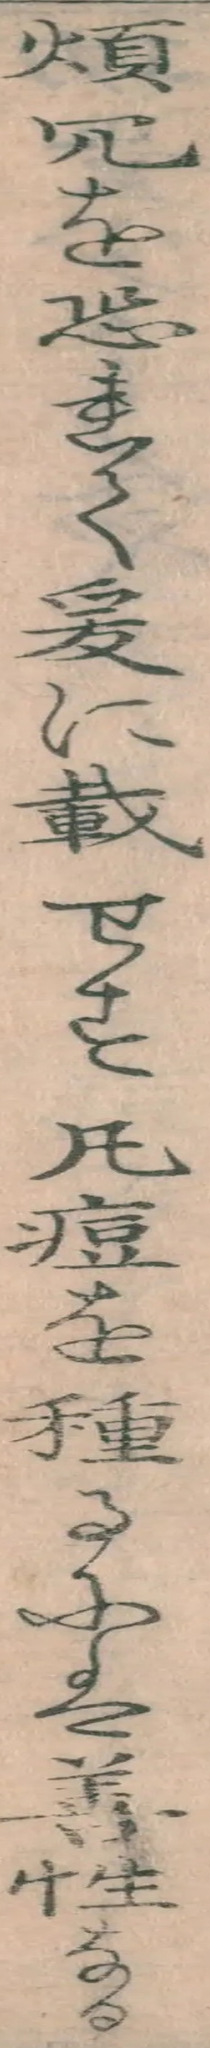煩冗を恐れて爰に載せす凡痘を種るには善性なる
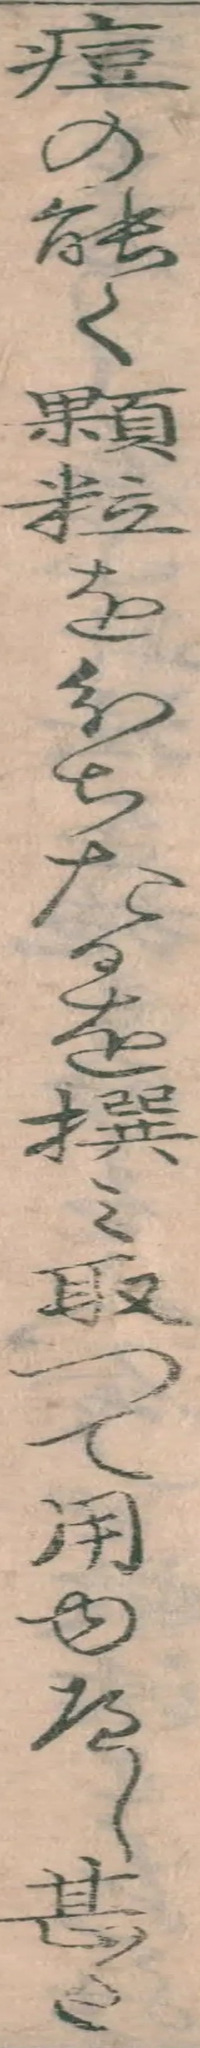痘の能く顆粒を分ちたるを撰み取つて用ゆへし甚た
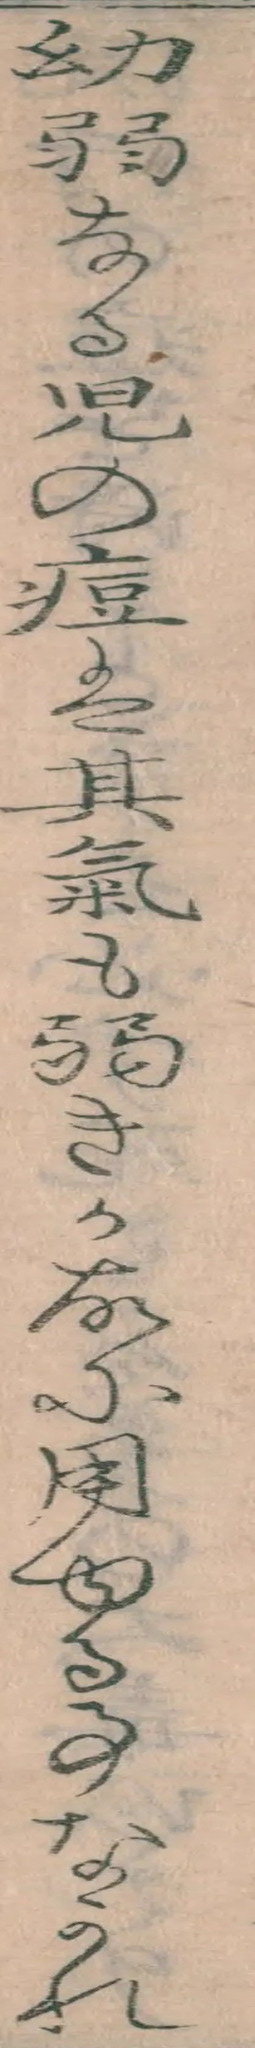幼弱なる児の痘は其氣も弱きか故に用ゆることなかれ
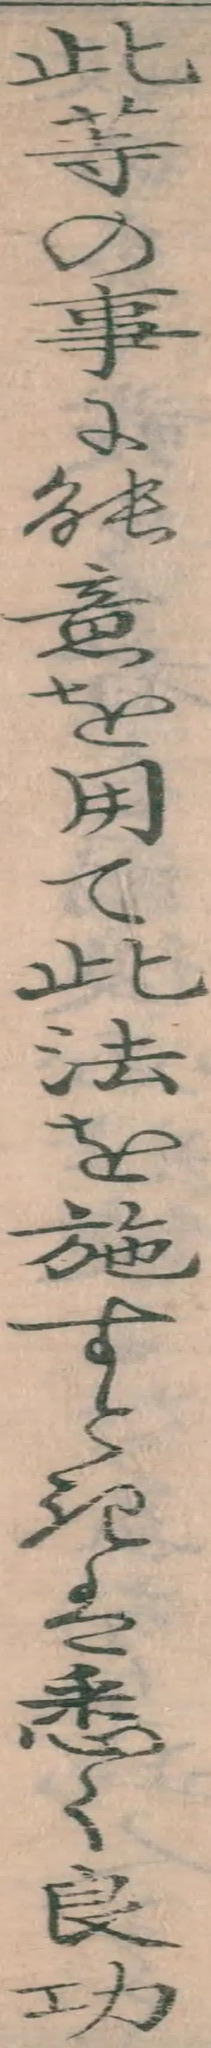此等の事に能意を用て此法を施すときは悉く良功
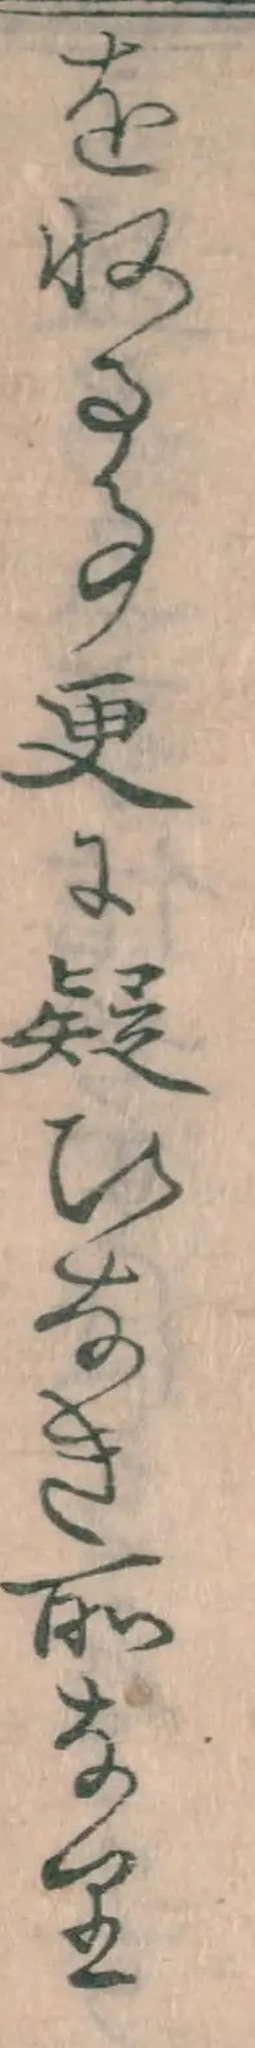を収る事更に疑ひなき所なり
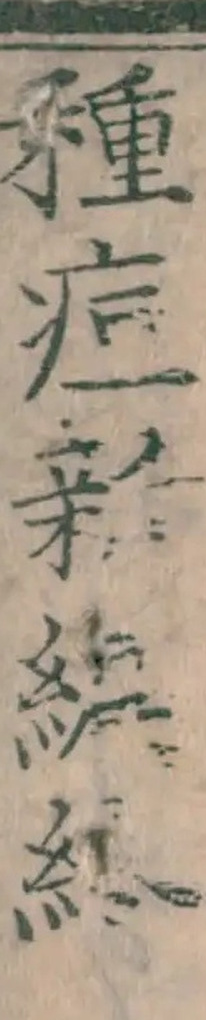種痘新編終
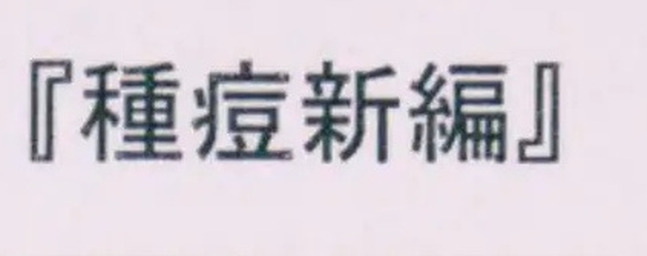種痘新編終
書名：種痘新編
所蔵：国立国会図書館 National Diet Library, JAPAN
